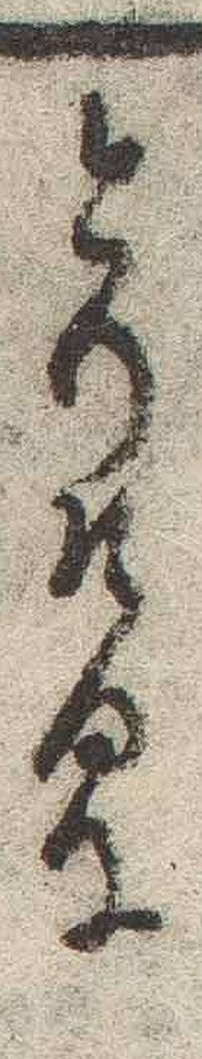とりけるに
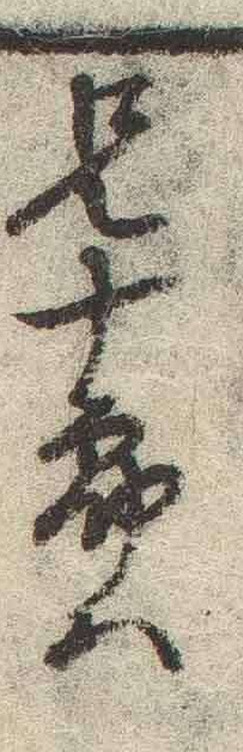兄十郎は
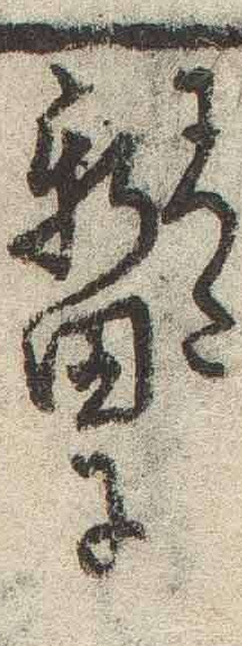新田に
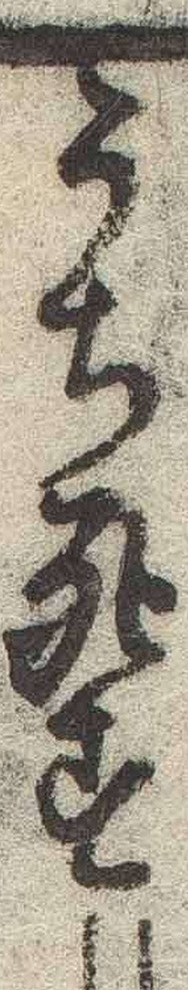うち死す
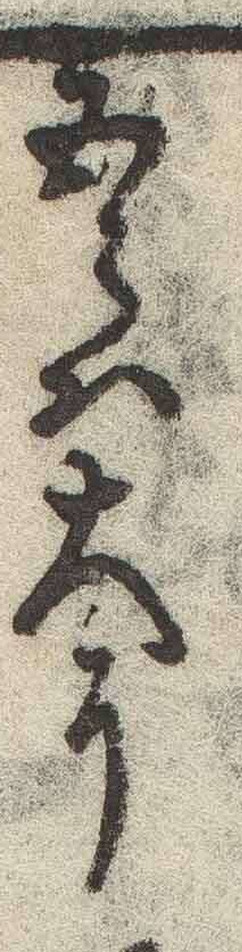五郎は大に
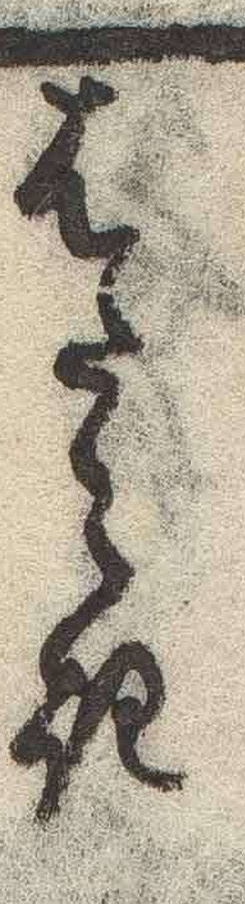はたらき
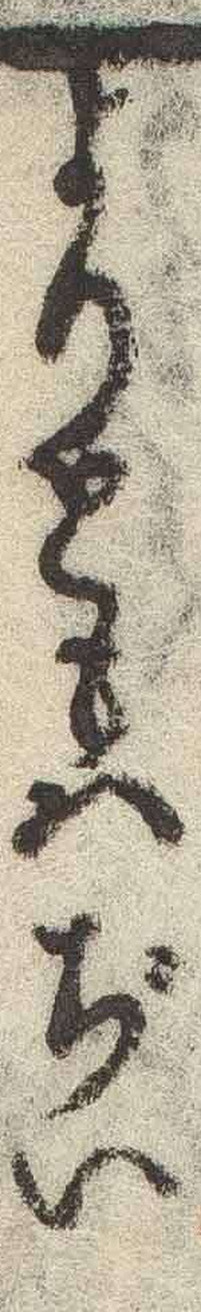よりともはぢい
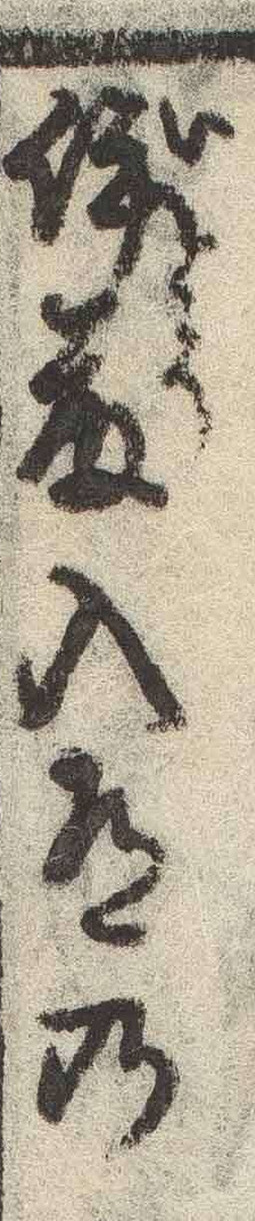伊藤入道の
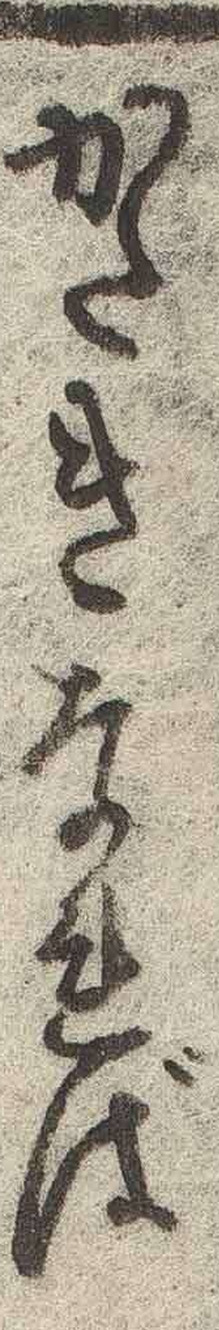かたきなれば
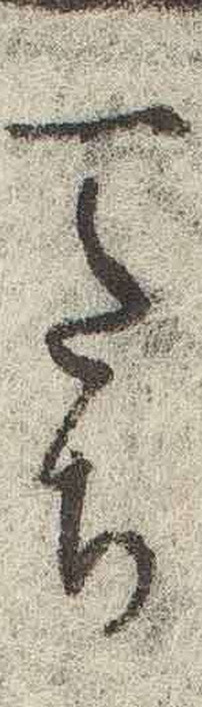一たち
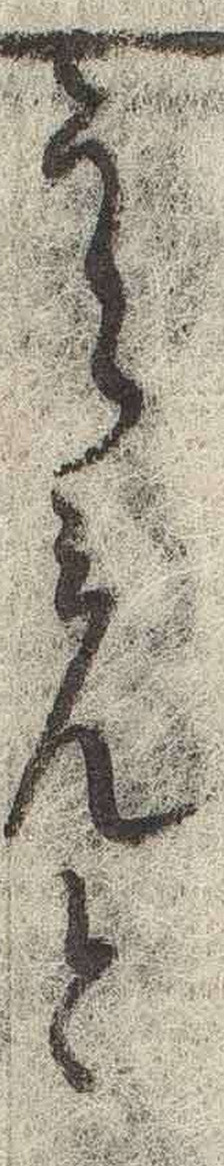うらみんと
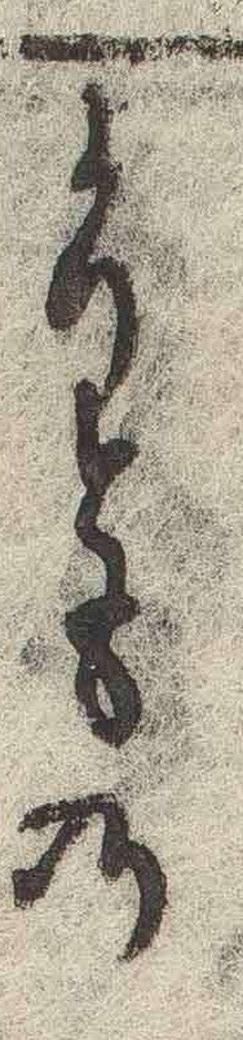よりともの
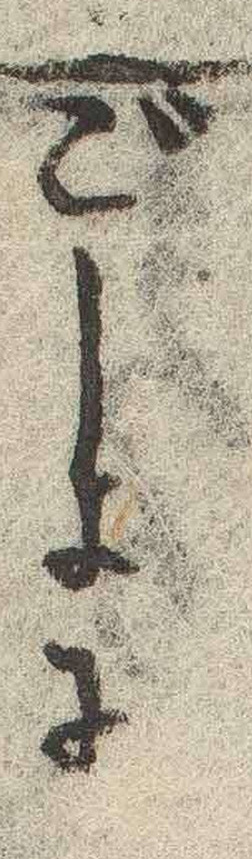ごしよに
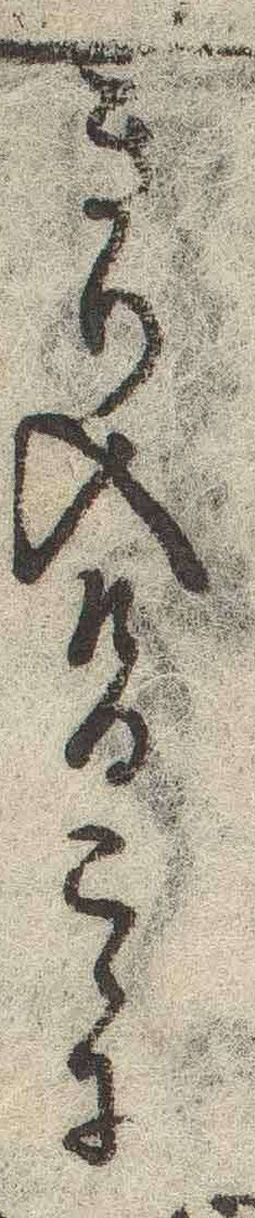きり入けるこゝに
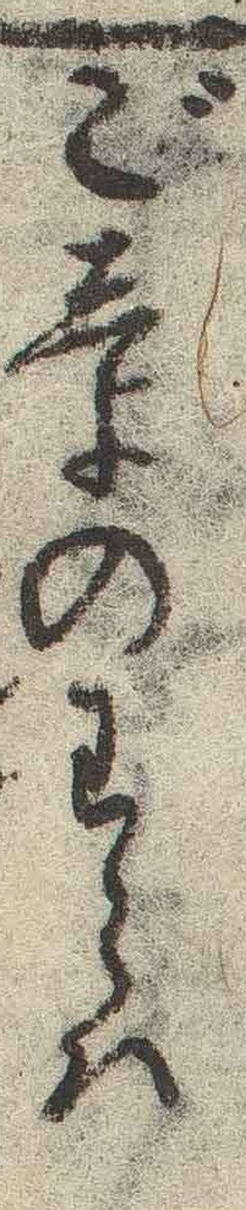ごしよのわらは
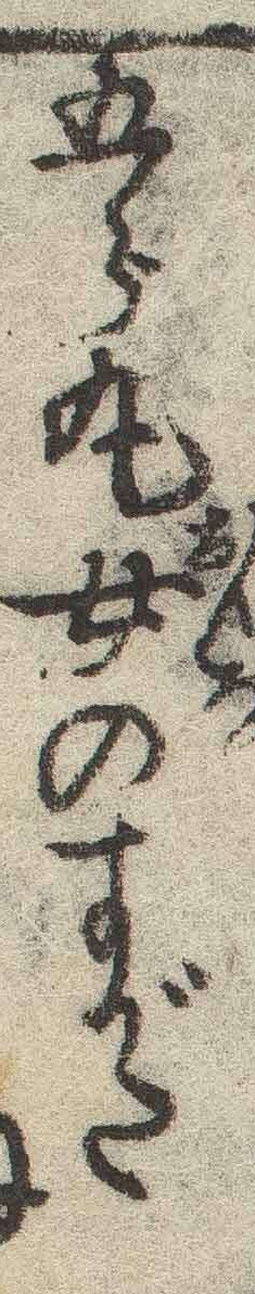五郎丸女のすがた
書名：末広扇
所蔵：東京学芸大学附属図書館 国文学研究資料館
